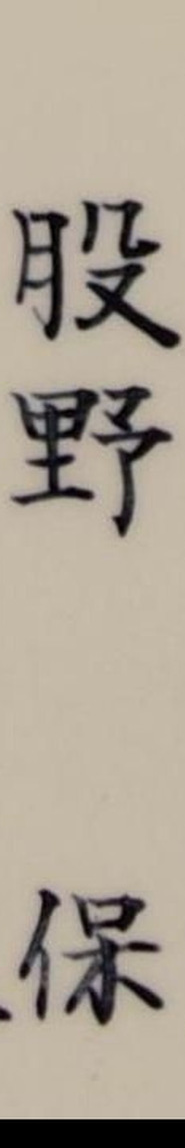股野保
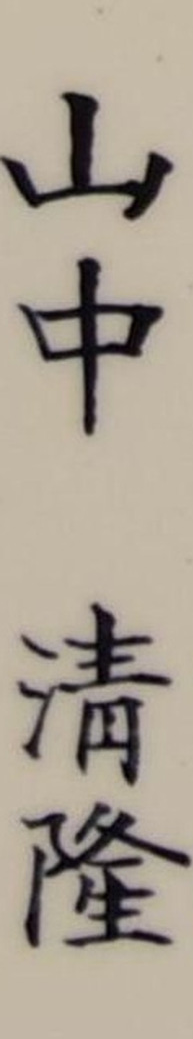山中清隆
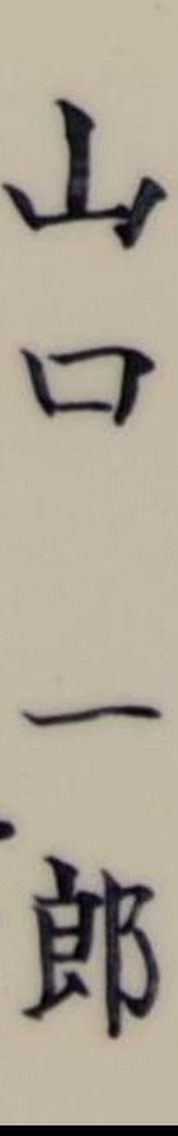山口一郎
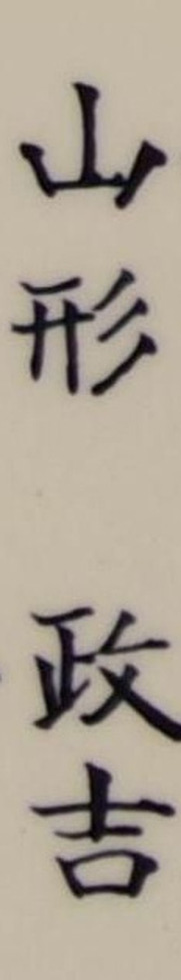山形政吉
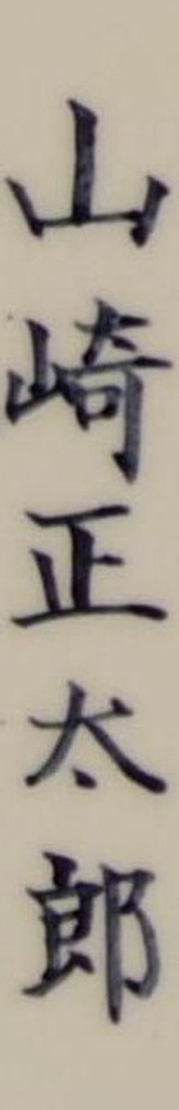山崎正太郎
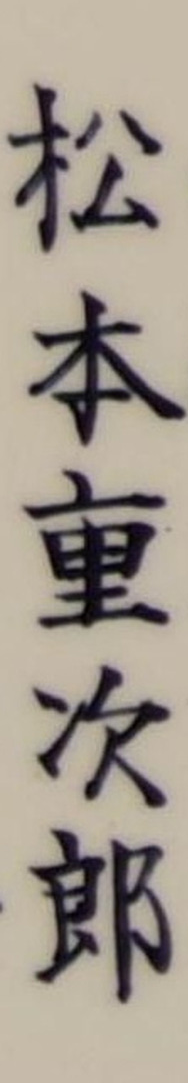松本重次郎
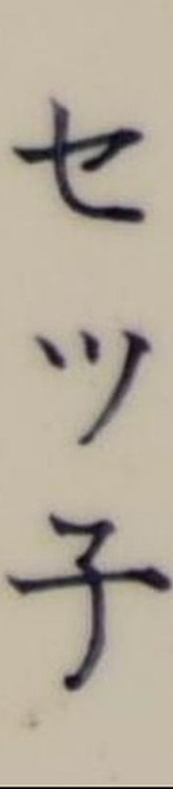セツ子

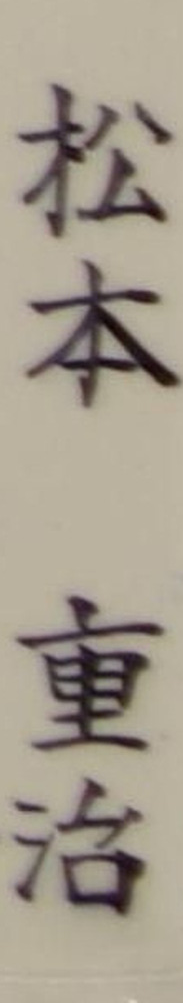松本重治
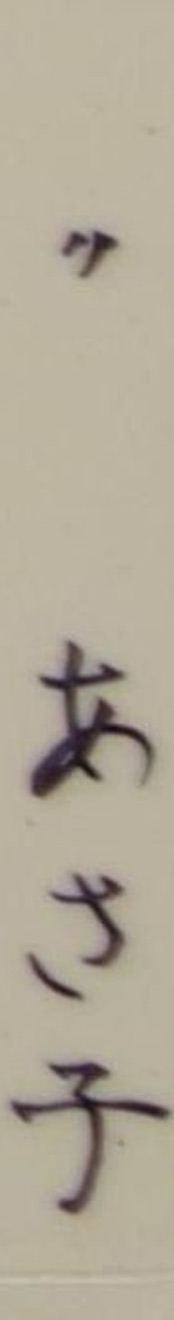あさ子
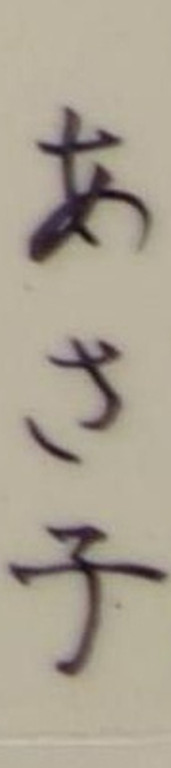あさ子
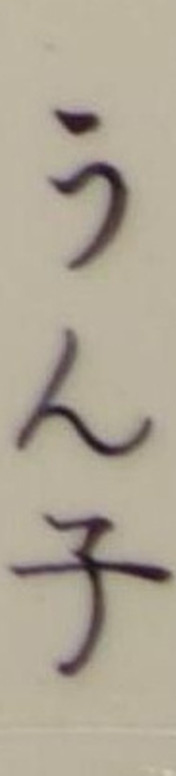うん子
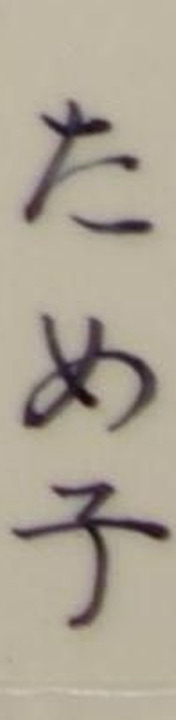ため子
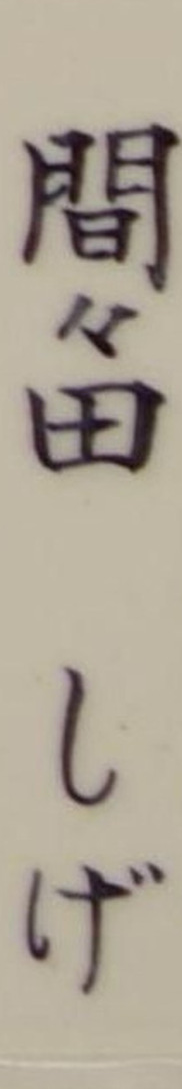間々田しげ
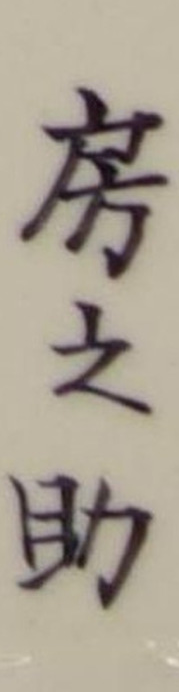房之助
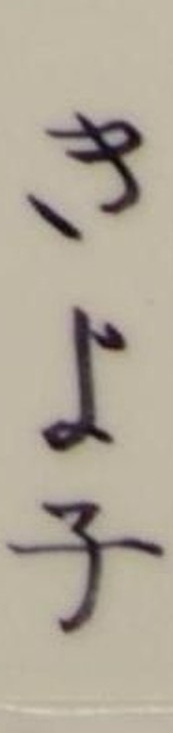きよ子
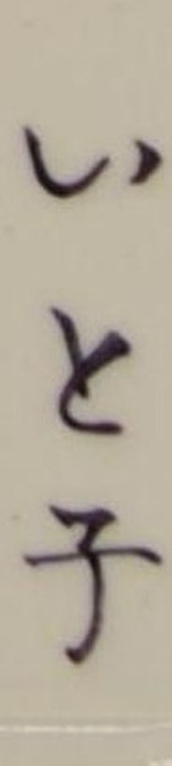いと子
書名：E~L
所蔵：高野山金剛峯寺
